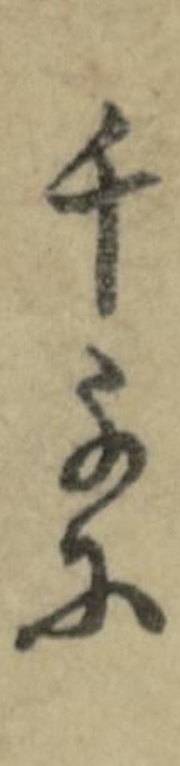千代に
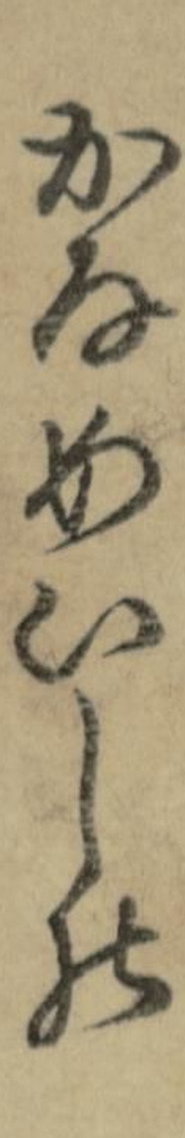かなめいしの
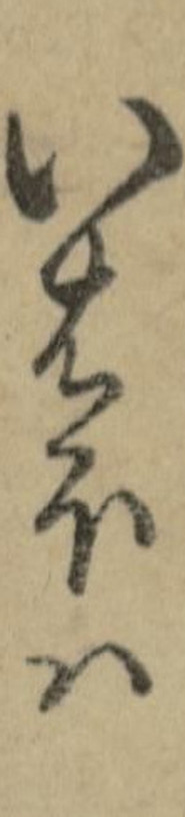いはほは
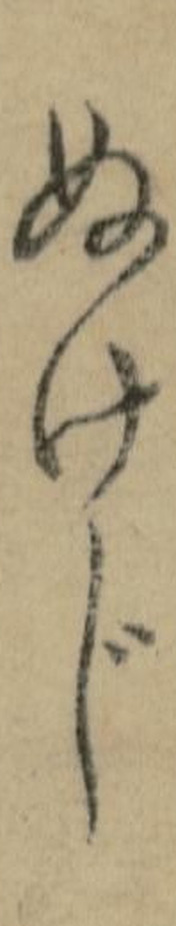ぬけじ
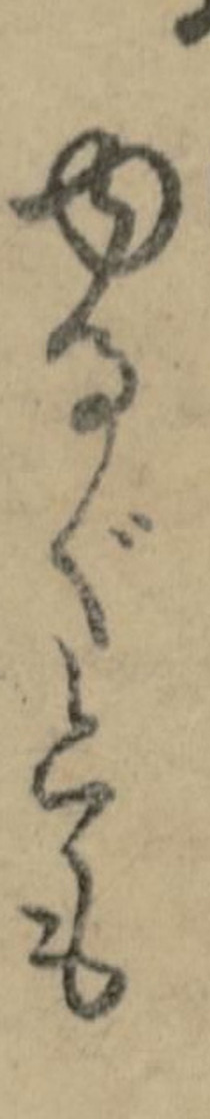ゆるぐとも
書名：[太平の御恩澤に]
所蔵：東京大学地震研究所図書室 Earthquake Research Institute Library, The University of Tokyo, JAPAN
